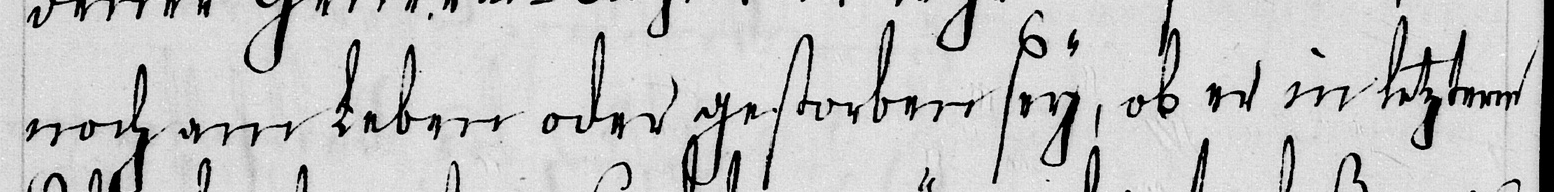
noch am Leben oder gestorben sey, ob er in letzterm
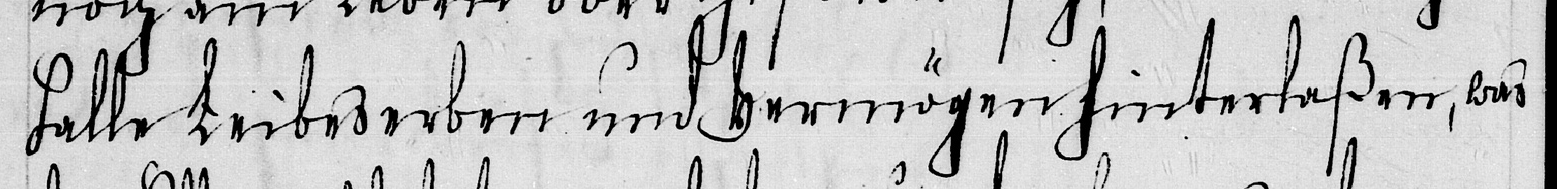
Falle Leibeserben und Vermögen hinterlaßen, was
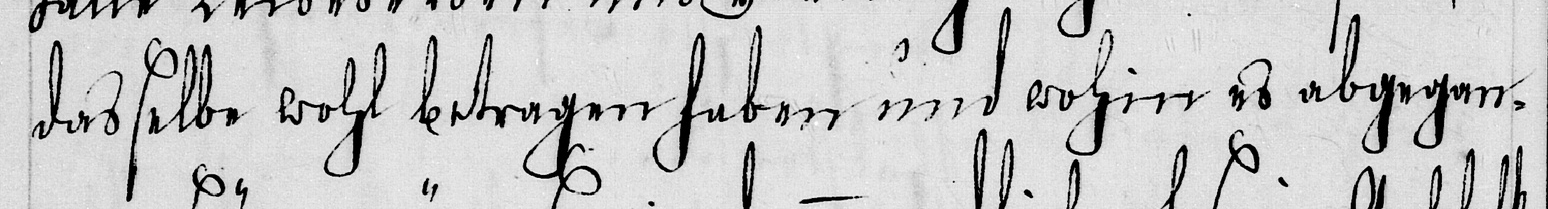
dasselbe wohl betragen haben und wohin es abgegan¬
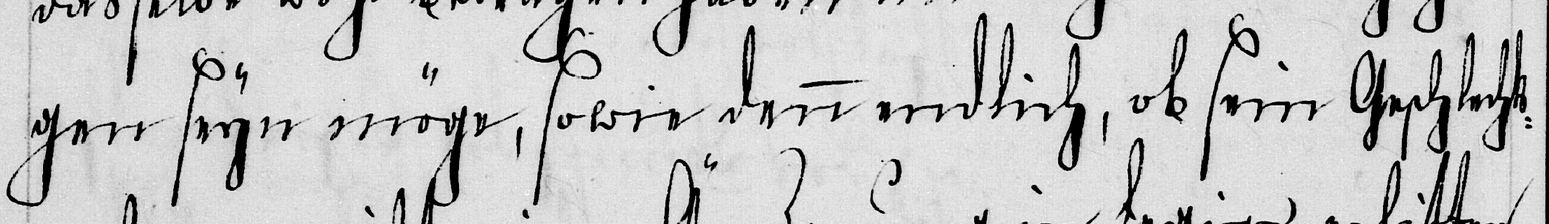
gen seyn möge, sowie denn endlich, ob sein Geschlec¬
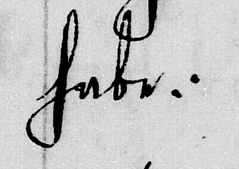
habe.
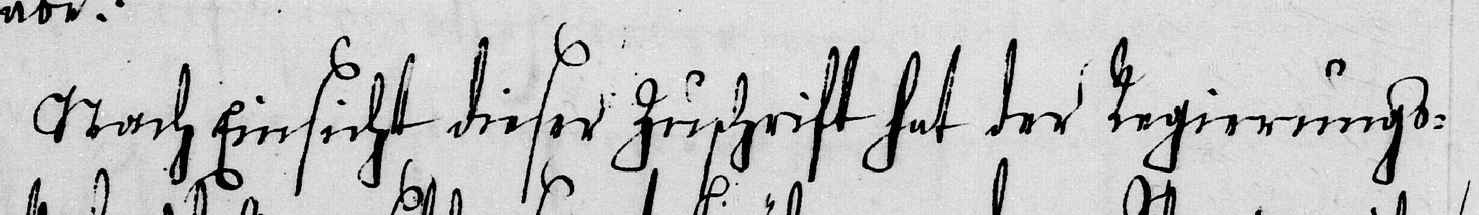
Nach Einsicht dieser Zuschrift hat der Regierungs¬
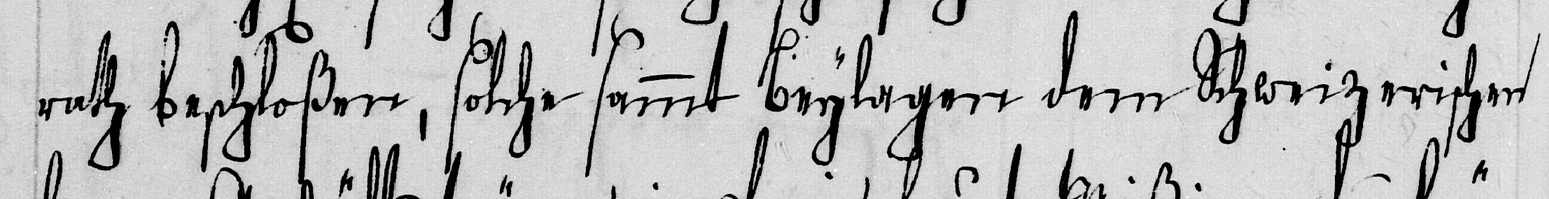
rath beschloßen, solche sammt Beylagen dem Schweizerischen
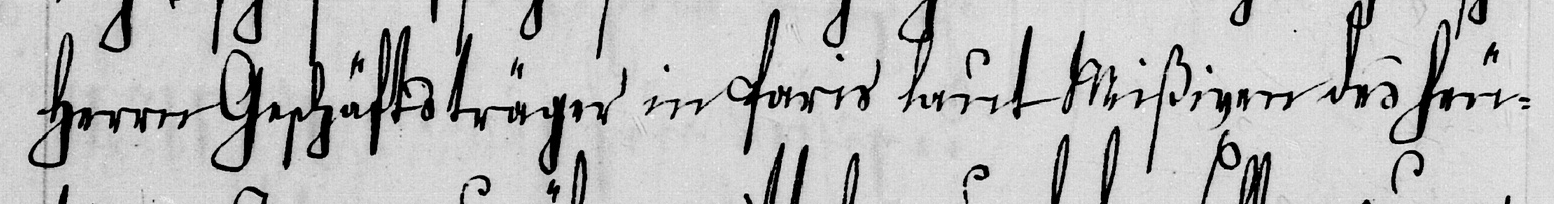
Herrn Geschäftsträger in Paris laut Mißiven des heu¬
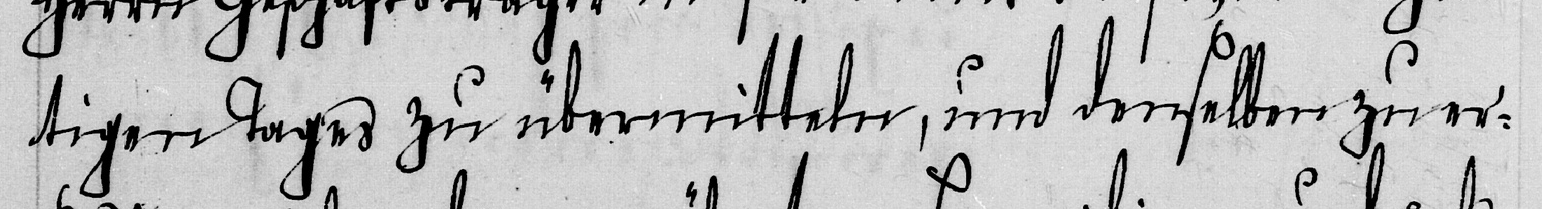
tigen Tages zu übermittelnm und denselben zu er¬
